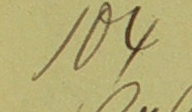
104
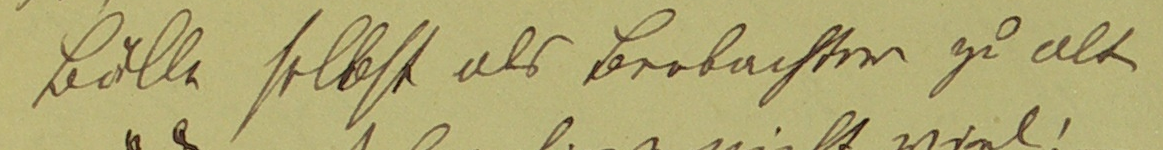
Bälle selbst als Beobachter zu alt
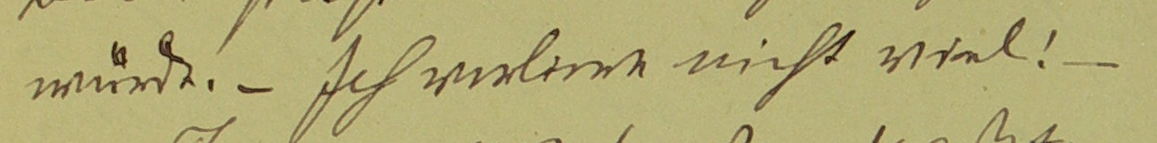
würde ?-Ich verliere nicht viel !,-
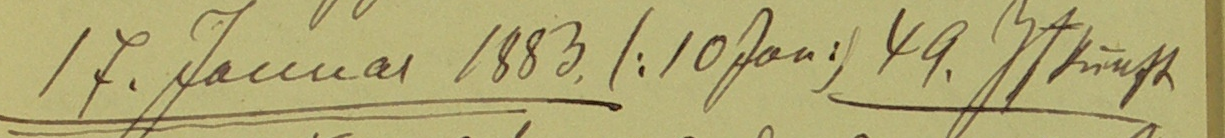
17. Januar 1883 (10 Jan.;) 49. Zusammenkunft
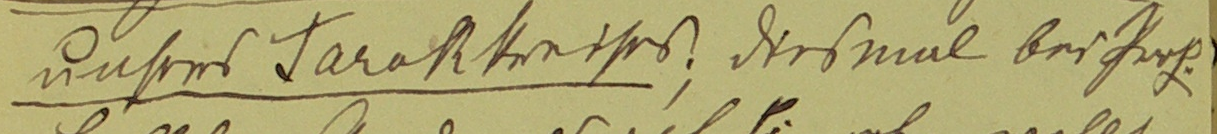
unseres Tarokkreises ; Diesmal bei Prof.
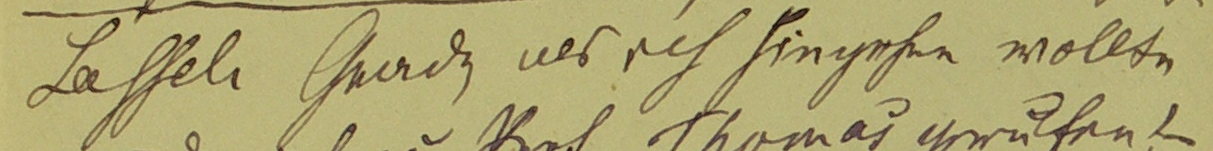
Lassel . Gerade als ich hingehen wollte
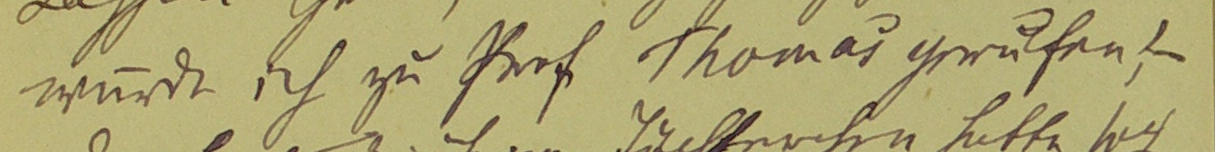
wurde ich zu Prof. Thomas gerufen,-
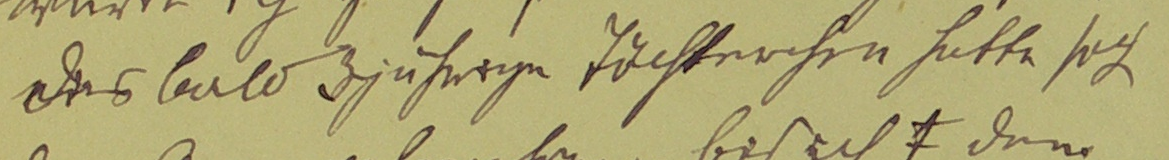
das bald 3 Jährige Töchterchen hatte sich
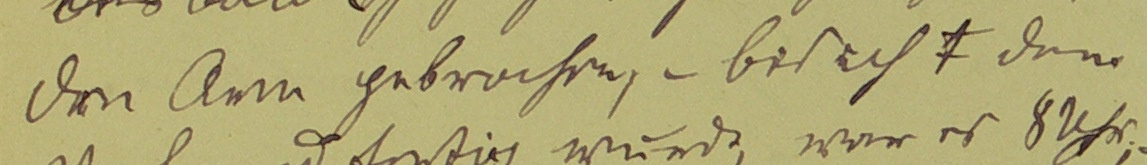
den Arm gebrochen,- bis ich mit dem
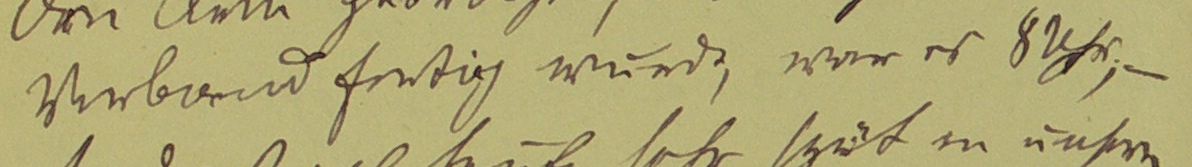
Verband fertig wurde, war es 8 Uhr
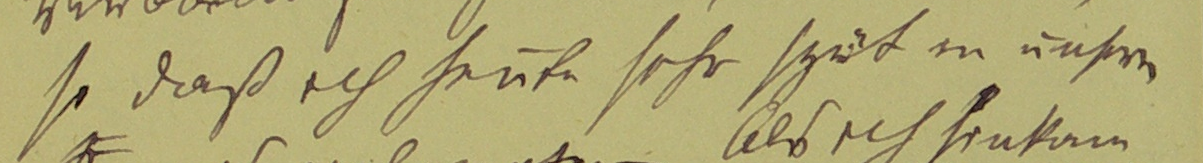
so daß ich heute sehr spät zu unserem
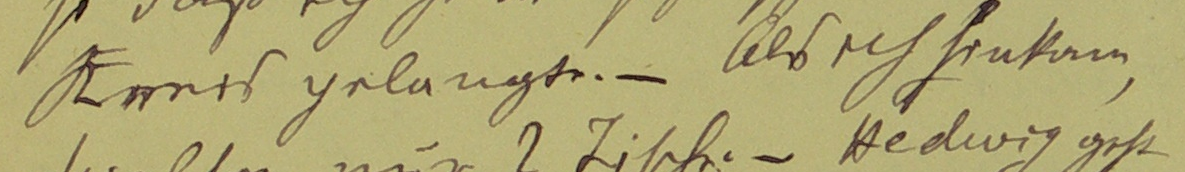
Kreis gelangte. Als ich hinkam
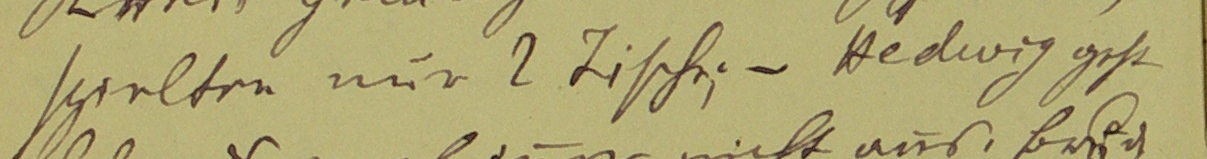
spielten nur 2 Tische;- Hedwig geht
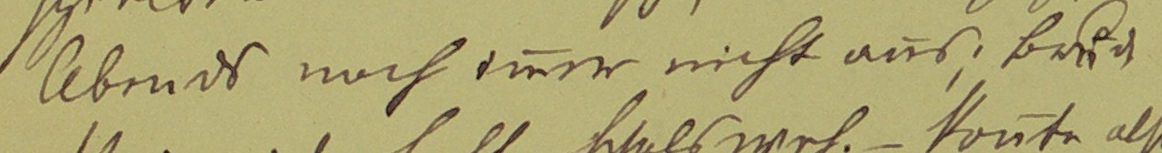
Abends noch immer nicht aus;- Bruder
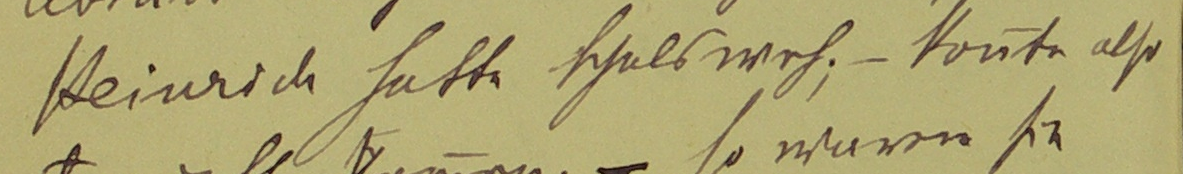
Heinrich hatte Halsweh,- konnte also
